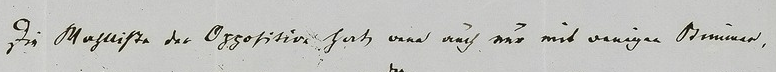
Die Wahlliste der Opposition hat, wenn auch nur mit wenigen Stimmen,
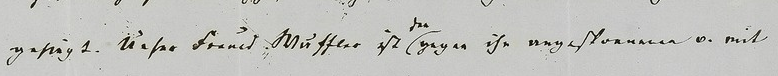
gesiegt. Unser Freund Wäffler ist den gegen ihn angesponnenen &. mit
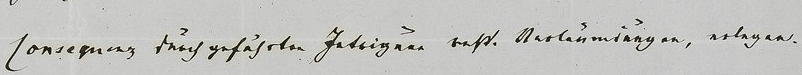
Consequenz durchgeführten Intriguen resp. Verleumdungen, erlegen.
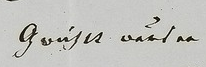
Gewählt wurden:
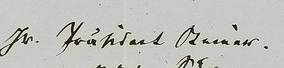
Hr. Präsident Steiner.
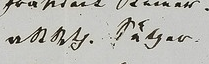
a RRth. Sulzer.
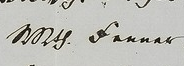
RRth. Fenner.
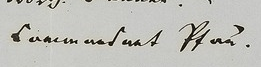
Commandant Pfau.
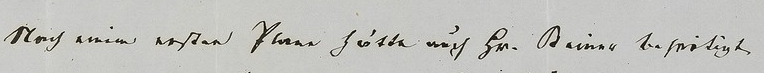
Nach einem ersten Plane hätte auch Hr. Steiner beseitigt
